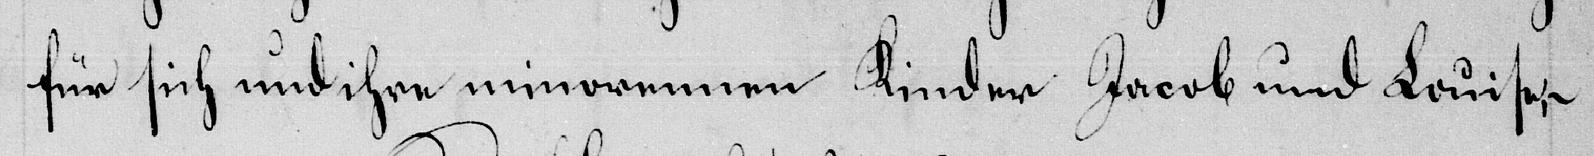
für sich und ihre minorennen Kinder Jacob und Louise,
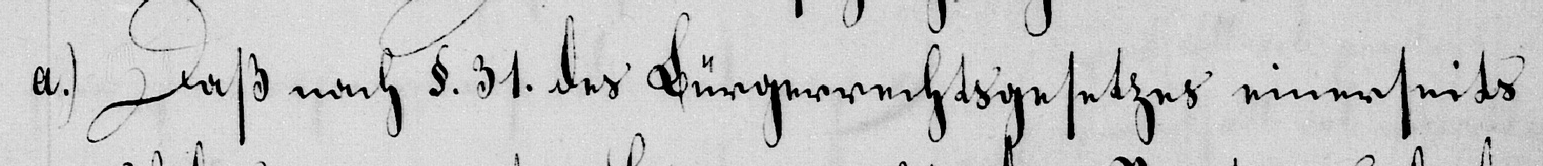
a.) Daß nach §. 31. des Bürgerrechtsgesetzes einerseits
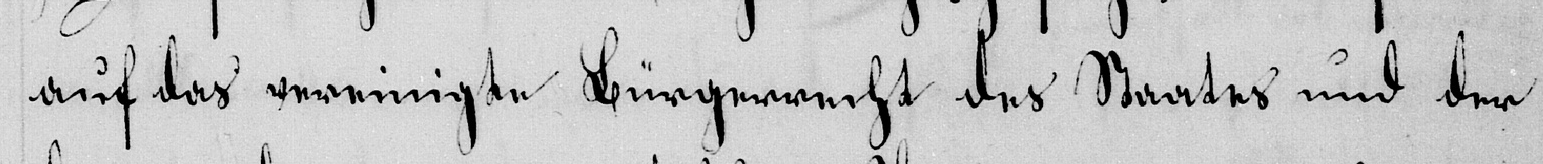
auf das vereinigte Bürgerrecht des Staates und der
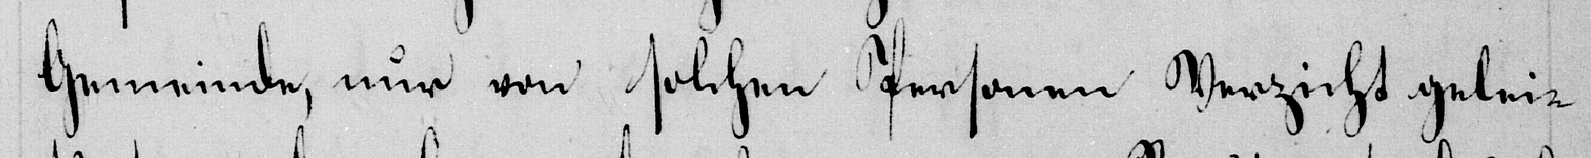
Gemeinde, nur von solchen Personen Verzicht gelei¬
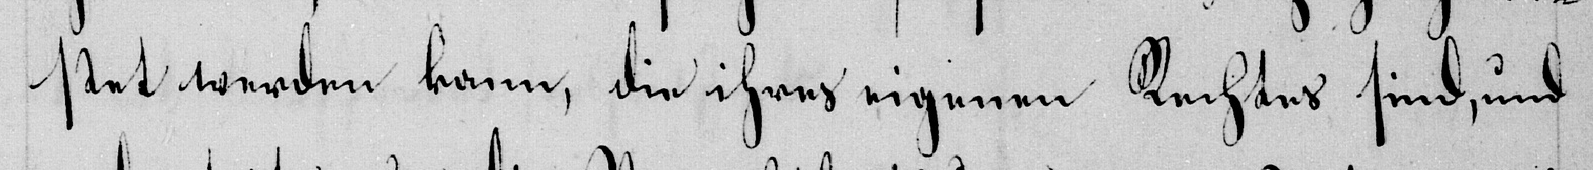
stet werden kann, die ihres eigenen Rechtes sind, und
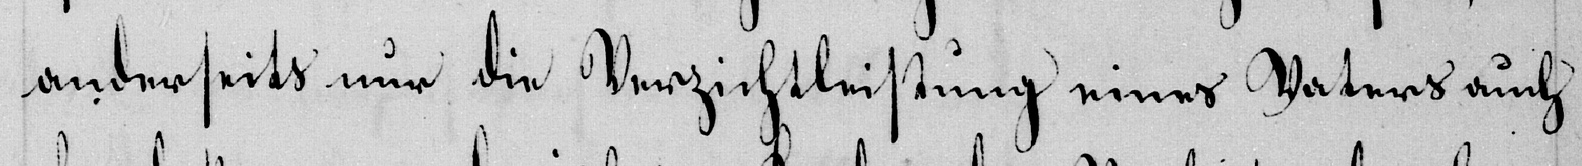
anderseits nur die Verzichtleistung eines Vaters auch
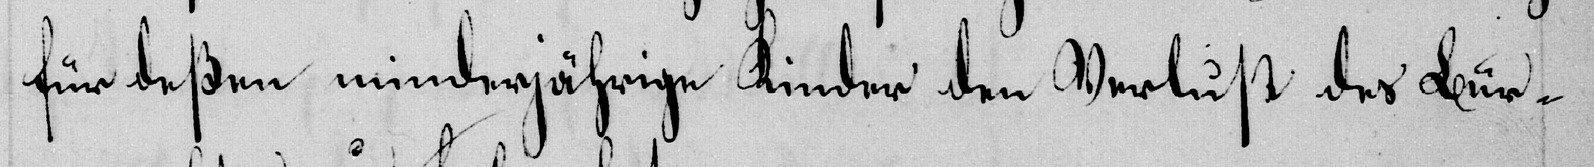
für deßen minderjährige Kinder den Verlust des Bür¬
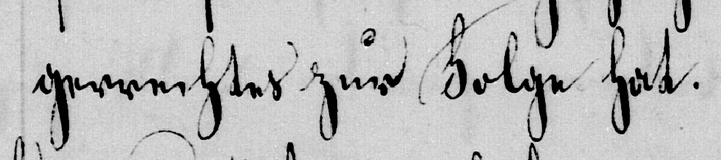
gerrechtes zur Folge hat.
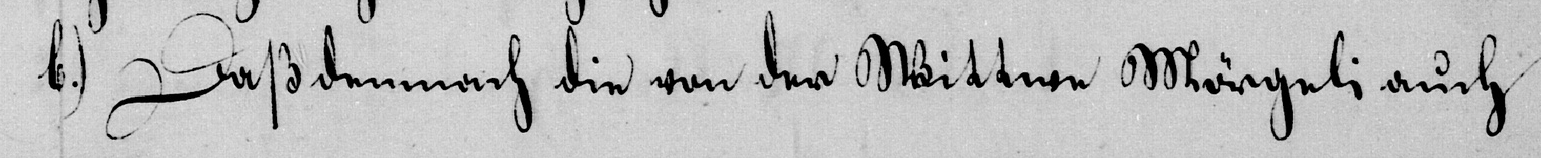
b.) Daß demnach die von der Wittwe Mörgeli auch
